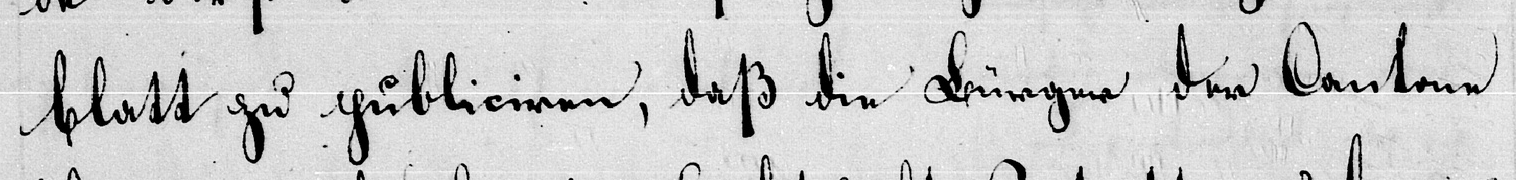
blatt zu publiciren, daß die Bürger der Cantone
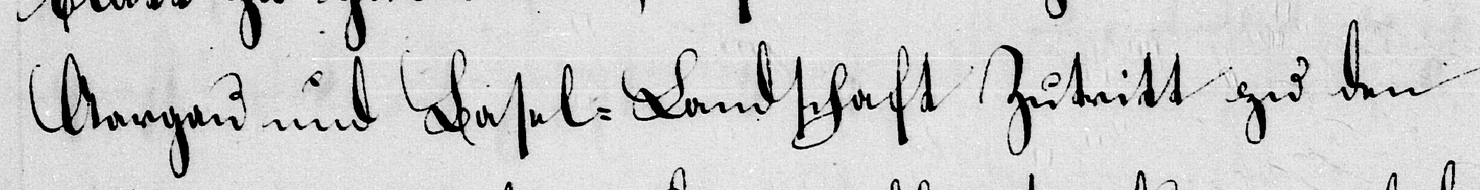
Aargau und Basel-Landschaft Zutritt zu den
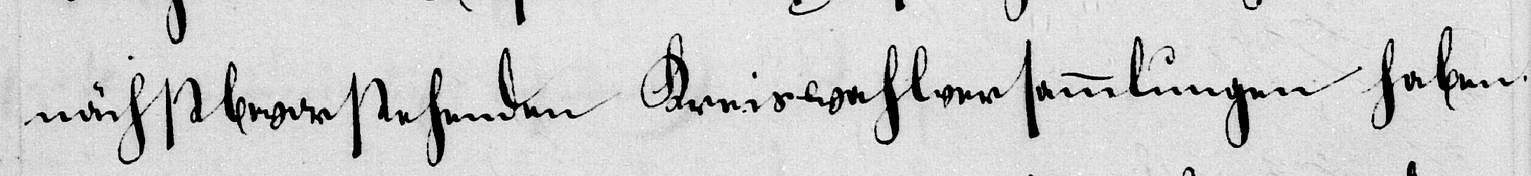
nächstbevorstehenden Kreiswahlversammlungen haben.
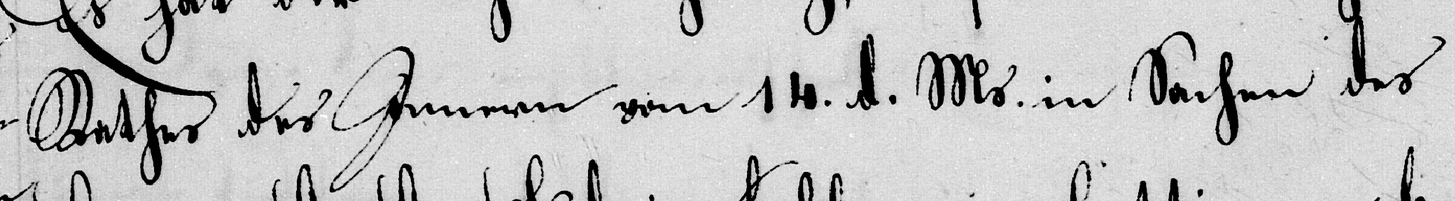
Rathes des Innern vom 14. d. Ms. in Sachen des
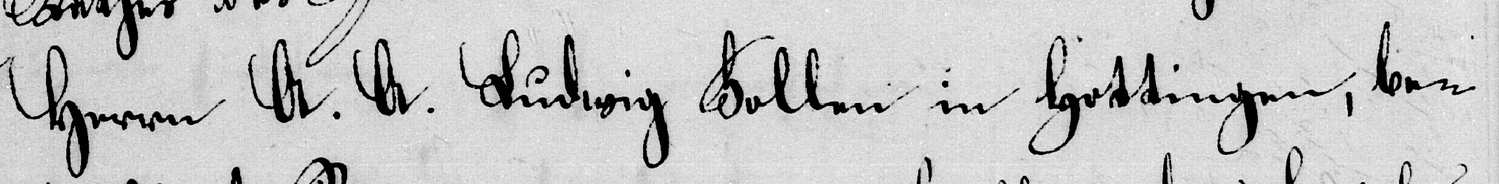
Herrn A. A. Ludwig Follen in Hottingen, be¬
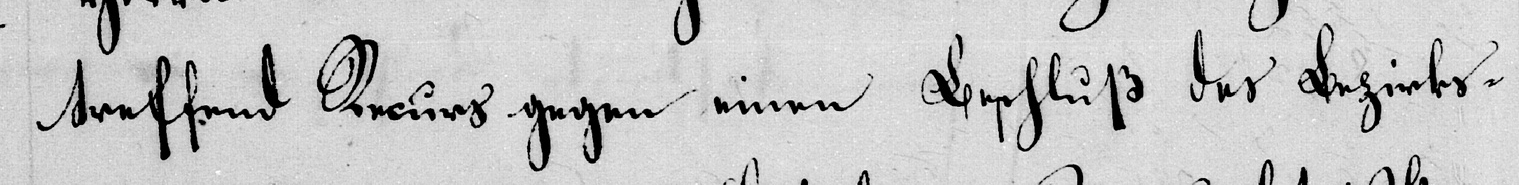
treffend Recurs gegen einen Beschluß des Bezirks¬
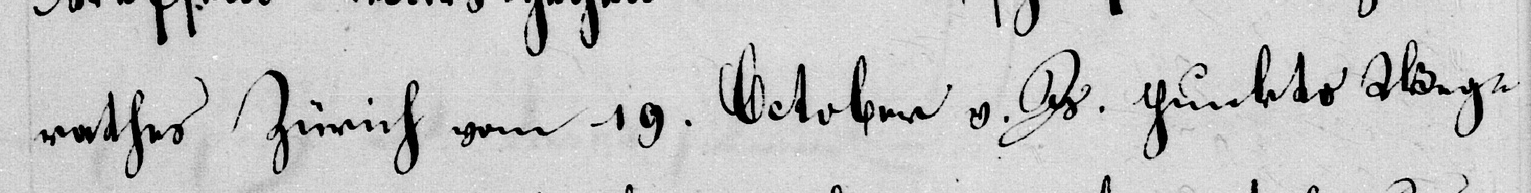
rathes Zürich vom 19. October v. Js. punkto Weg¬
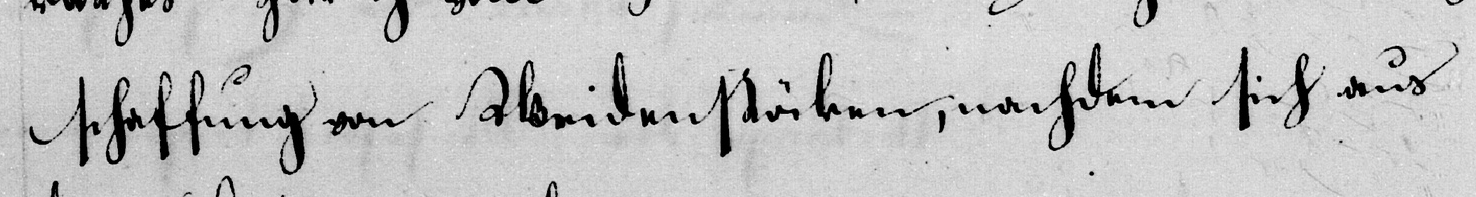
schaffung von Weidenstöcken, nachdem sich aus
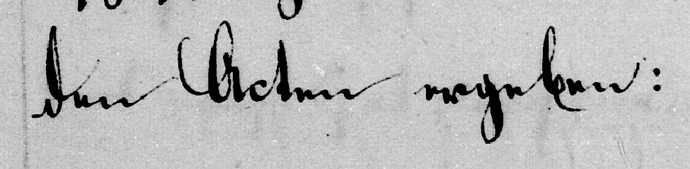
den Acten ergeben:
